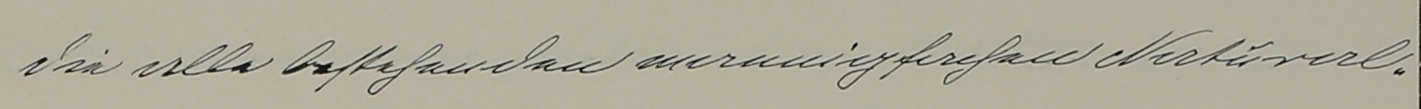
die alle bestehenden mannigfachen Natural-
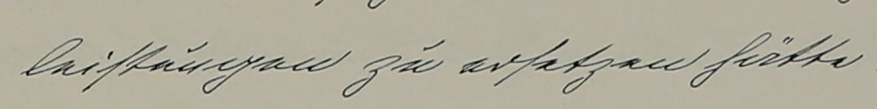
leistungen zu ersetzen hätte.
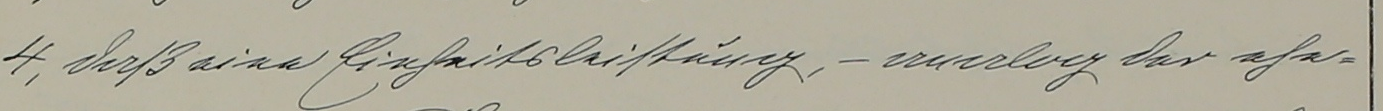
4. daß eine Einheitsleistung, – analog der ehe-
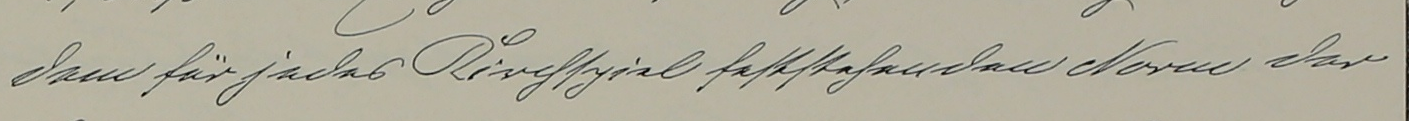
dem für jedes Kirchspiel feststehenden Norm der
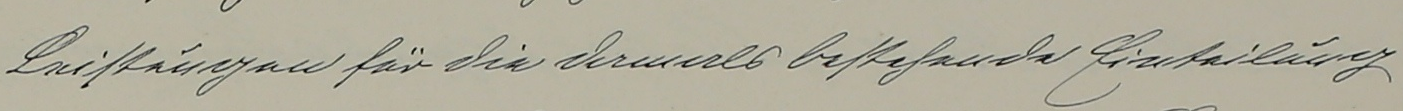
Leistungen für die damals bestehende Einteilung
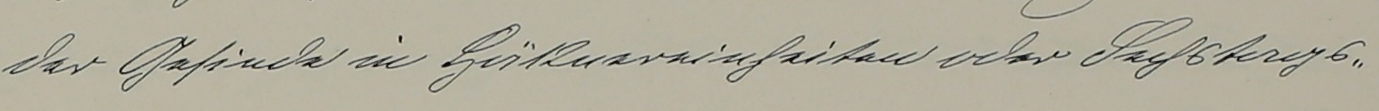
der Gesinde in Häknereinheiten oder Sechstags-
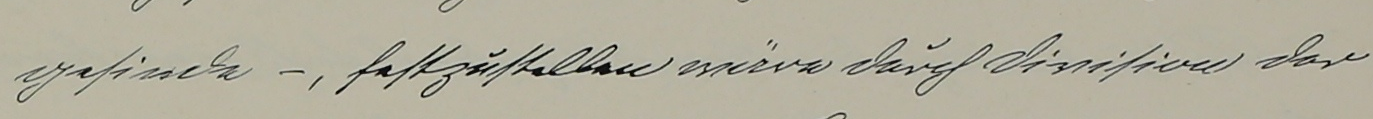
gesinde –, festzustellen wäre durch Division der
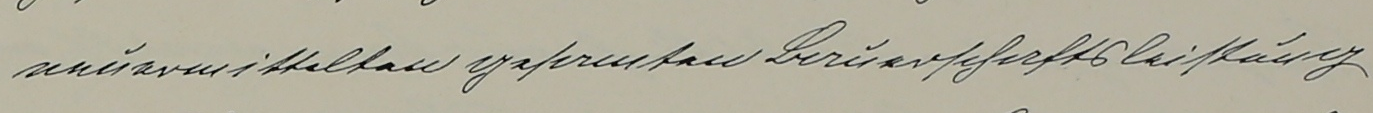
neuermittelten gesamten Bauerschaftsleistung
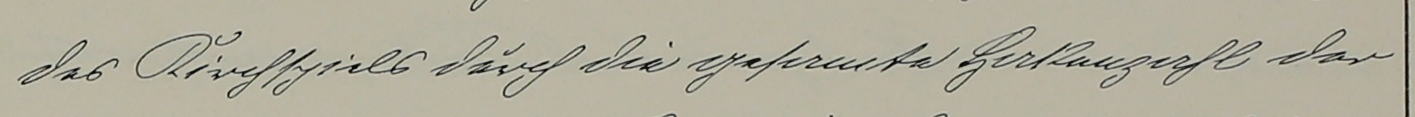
des Kirchspiels durch die gesamte Hakenzahl der
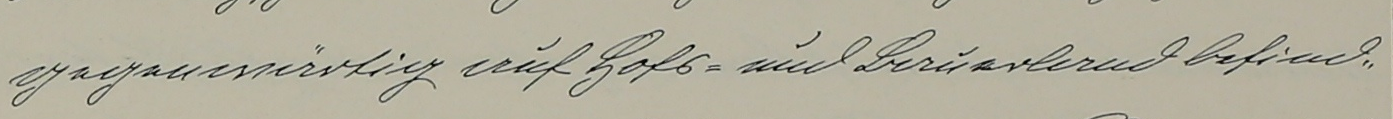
gegenwärtig auf Hofs- und Bauerland befind-
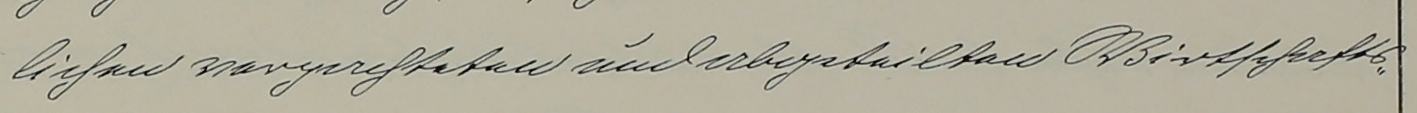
lichen verpachteten und abgeteilten Wirtschafts-
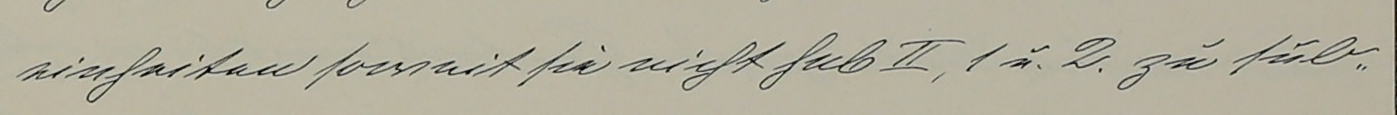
einheiten, soweit sie nicht sub II,1 u. 2. zu sub-
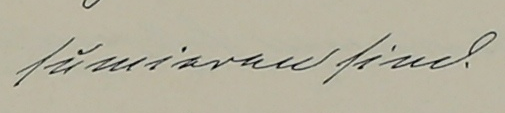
summieren sind.
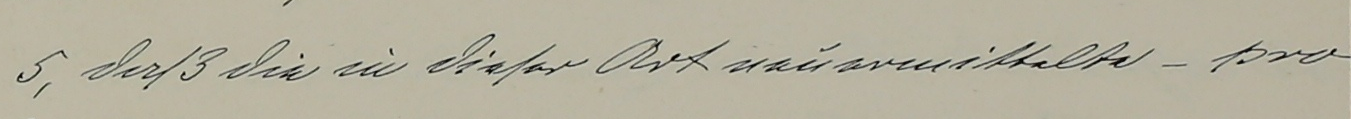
5. daß die in dieser Art neuermittelte – pro
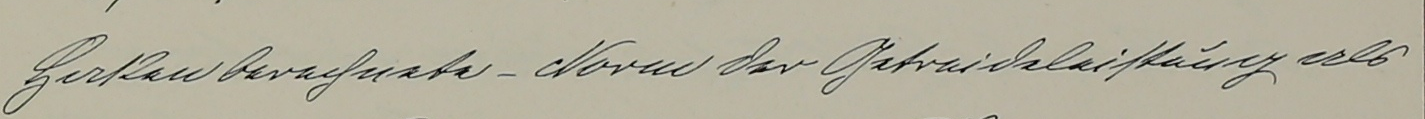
Haken berechnete – Norm der Getreideleistung als
